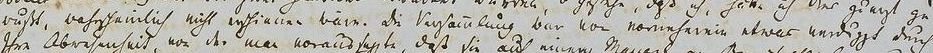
wußt, wahrscheinlich nicht erschienen wäre. Die Versammlung war von vornherein etwas verduzzt durch
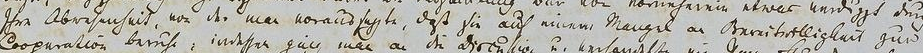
Ihre Abwesenheit, von der man voraussezzte, daß sie auf einem Mangel an Bereitwilligkeit zur
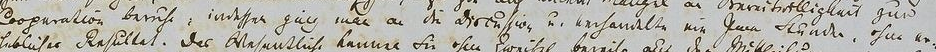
Cooperation beruhe; indessen ging man an die Discussion u. verhandelte ein Paar Stunden, ohne er-
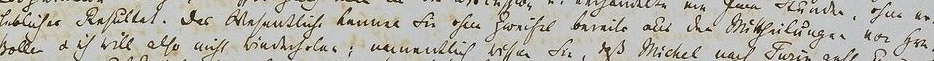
hebliches Resultat. Das Wesentliche kennen Sie ohne Zweifel bereits aus den Mittheilungen von Hrn.
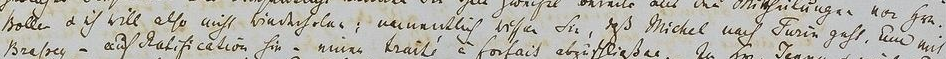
Boller & ich will also nicht wiederholen; namentlich wissen Sie, daß Michel nach Turin geht, um mit
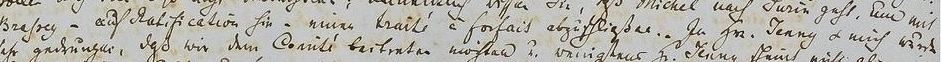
Brassey – auf Ratification hin – einen traité à forfait abzuschließen. In Hrn. Jenny & mich wurde
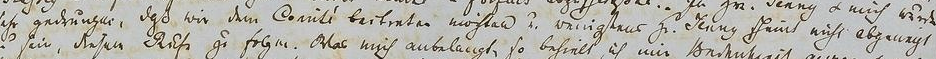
sehr gedrungen, daß wir dem Comité beitreten möchten u. wenigstens Hr. Jenny scheint nicht abgeneigt
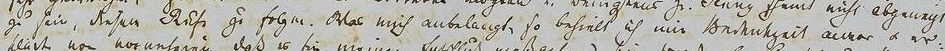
zu sein, diesem Rufe zu folgen. Was mich anbelangt, so behielt ich mir Bedenkzeit anvor & er-
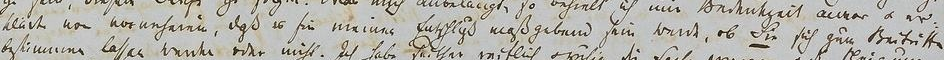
klärte von vorneherein, daß es für meinen Entschluß maßgebend sein werde, ob Sie sich zum Beitritte
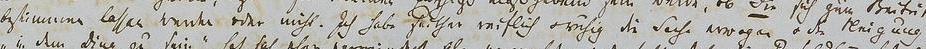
bestimmen lassen werden oder nicht. Ich habe seither reiflich & ruhig die Sache erwogen & die Neigung,
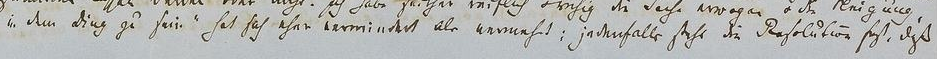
«in dem Ding zu sein» hat sich eher vermindert als vermehrt; jedenfalls steht die Resolution fest, daß
